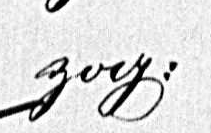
zog:
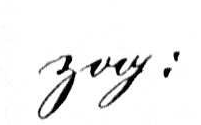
zog:
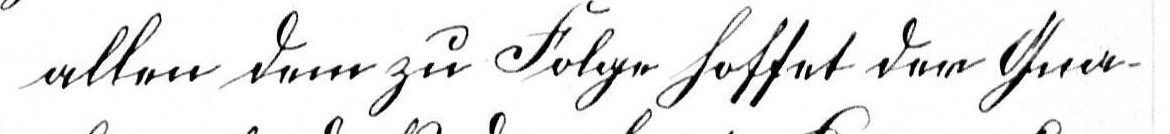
allen dem zu Folge hoffet der Gna¬
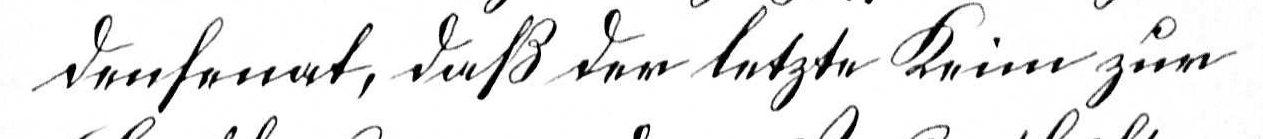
densenat, daß der letzte Keim zur
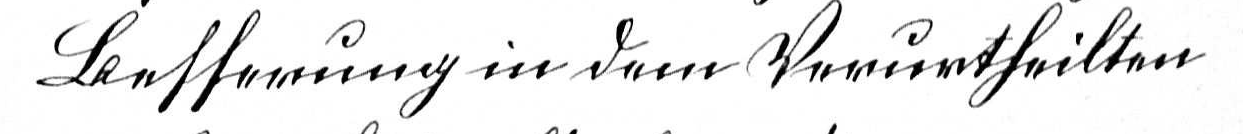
Besserung in dem Verurtheilten
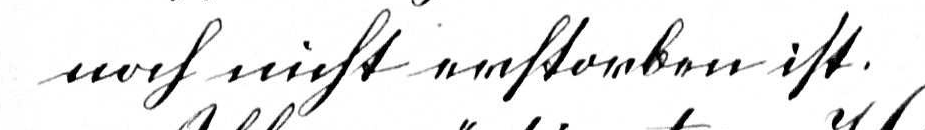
noch nicht erstorben ist.
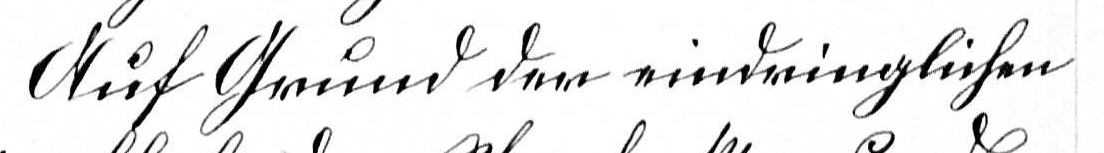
Auf Grund der eindringlichen
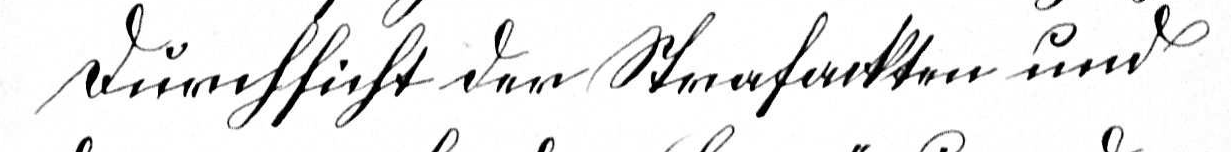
Durchsicht der Strafackten und
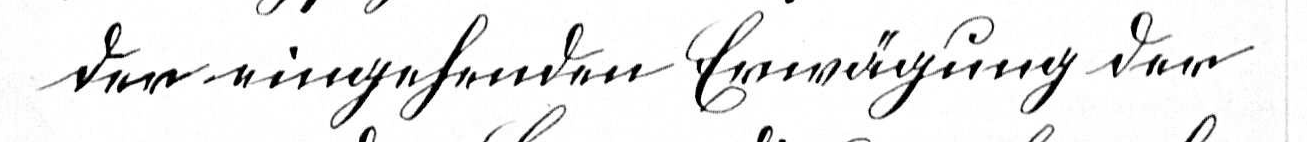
der eingehenden Erwägung der
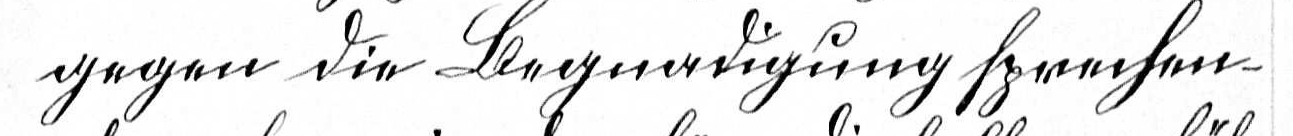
gegen die Begnadigung sprechen¬
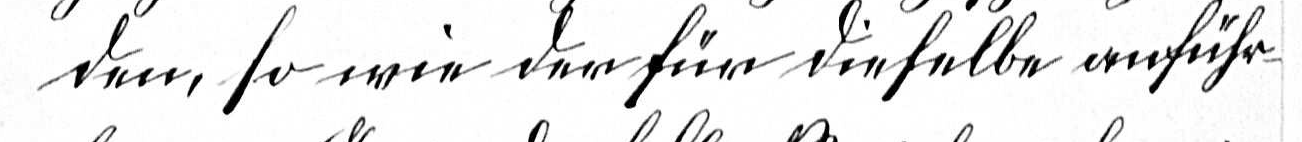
den, so wie der für dieselbe anführ¬
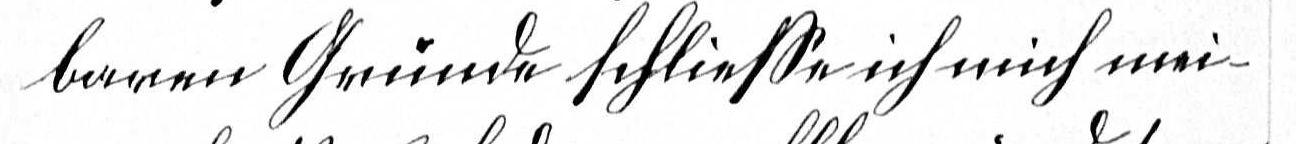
baren Gründe schließe ich mich mei¬
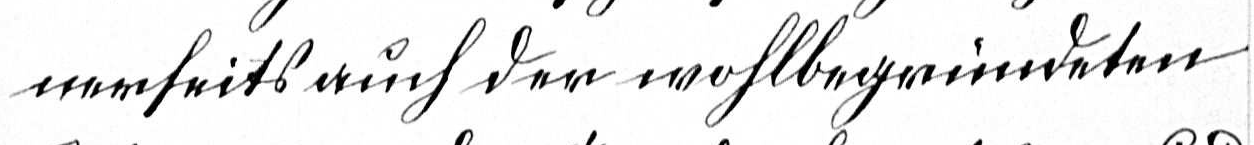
nerseits auch der wohlbegründeten
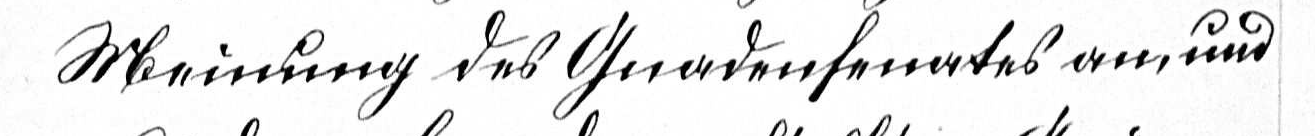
Meinung des Gnadensenates an, und
